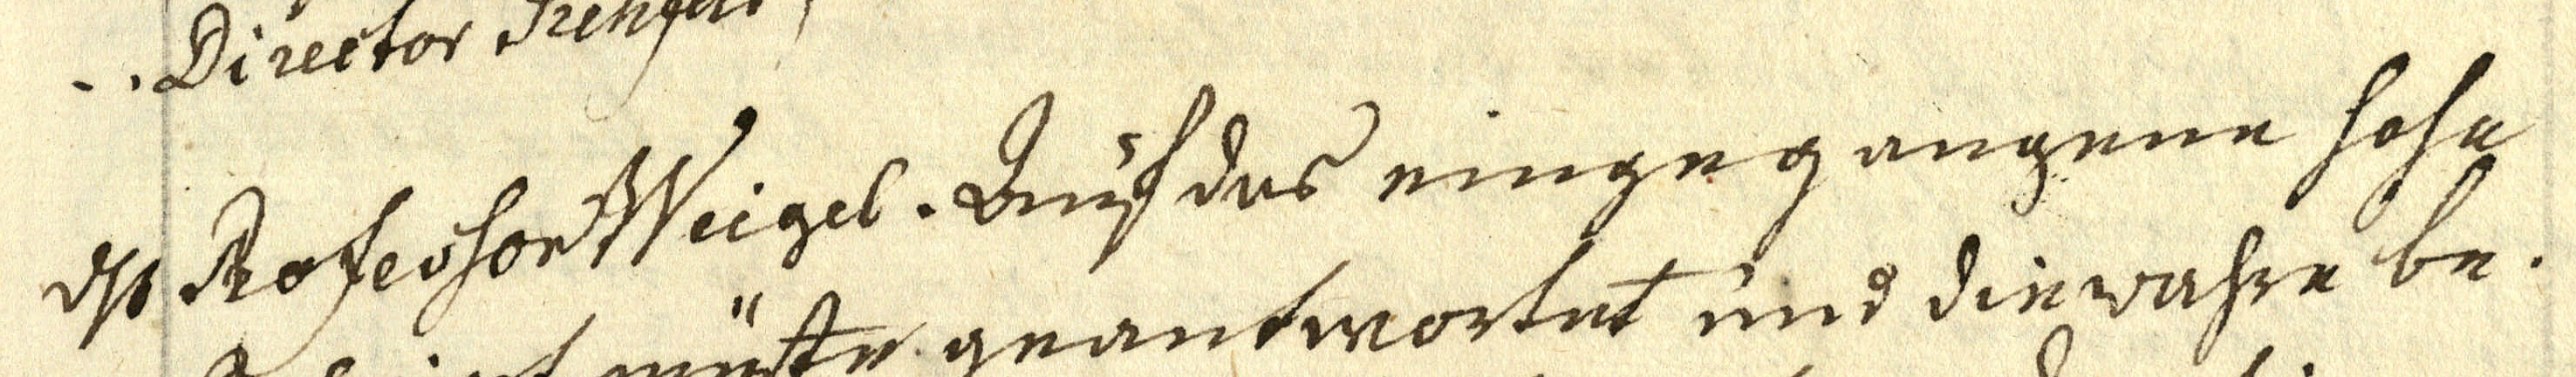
dh Professor Weigel. Auf das eingegangene hohe
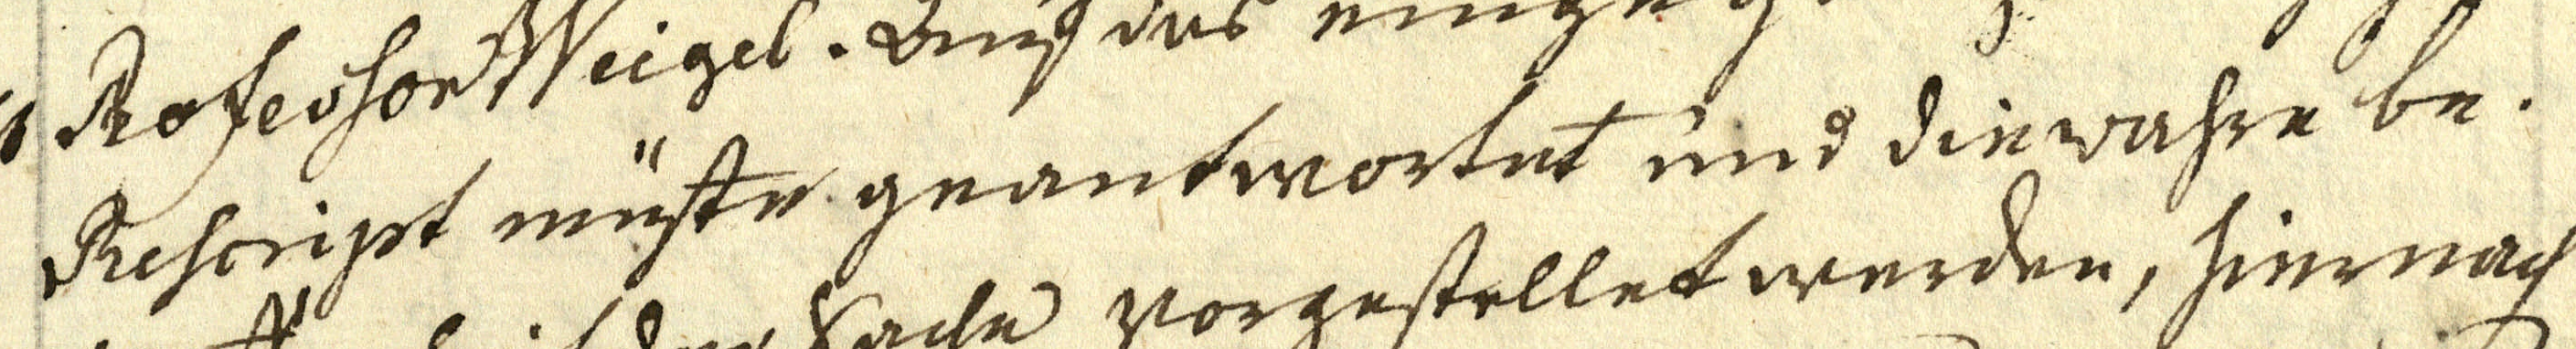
Rescript müste geantwortet und die wahre Be¬
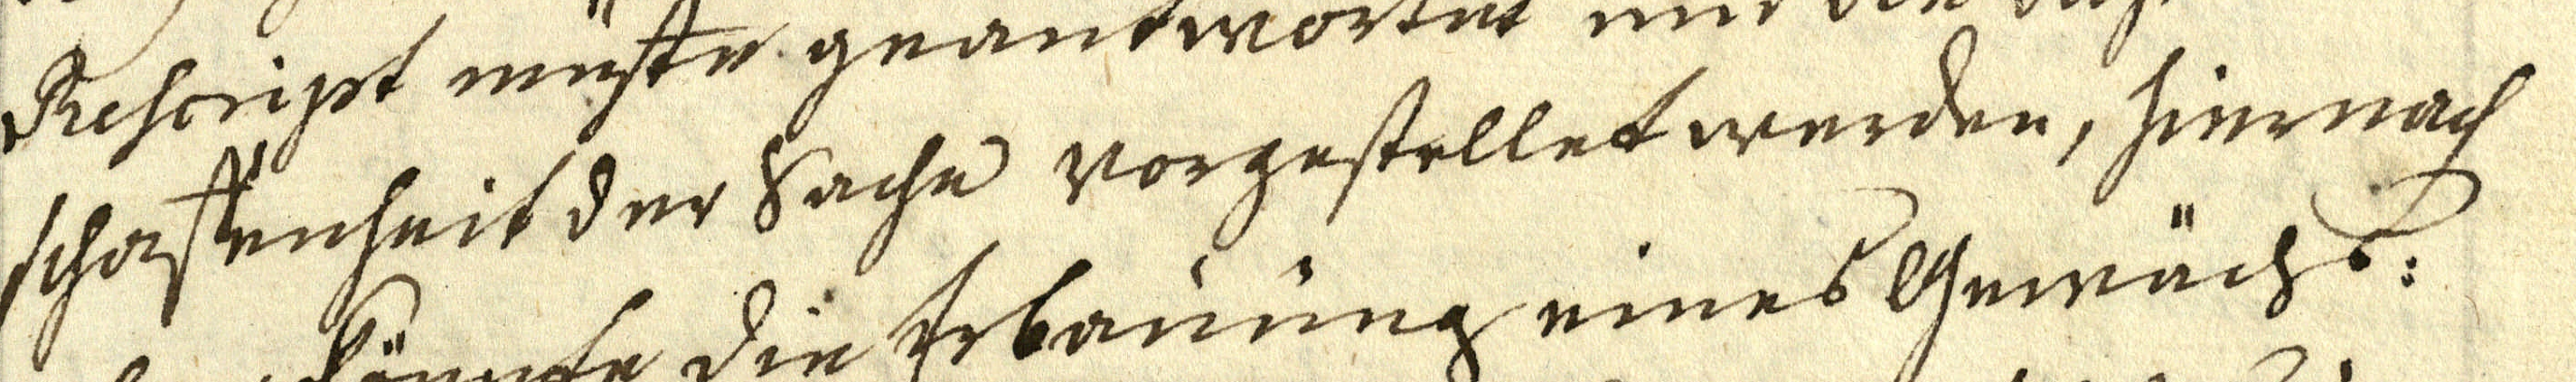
schaffenheit der Sache vorgestellet werden, hiernach
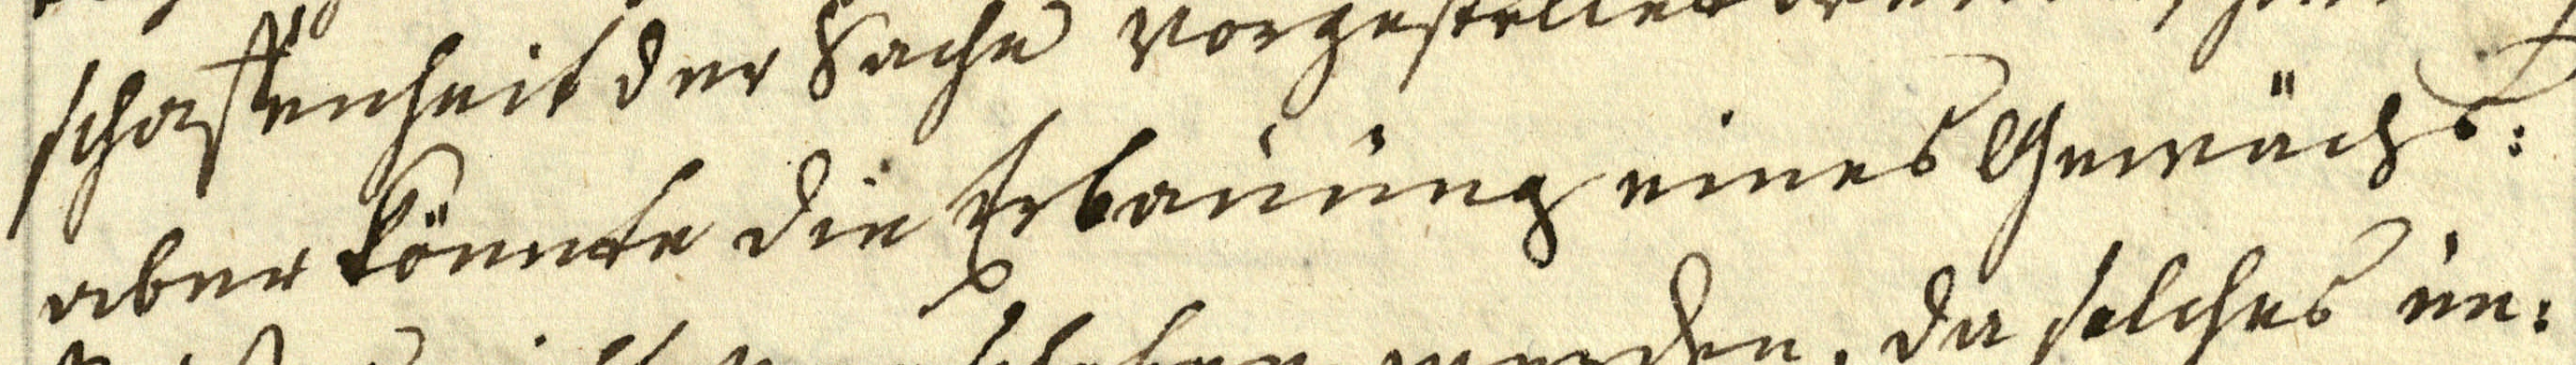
aber könnte die Erbauung eines Gewächs¬
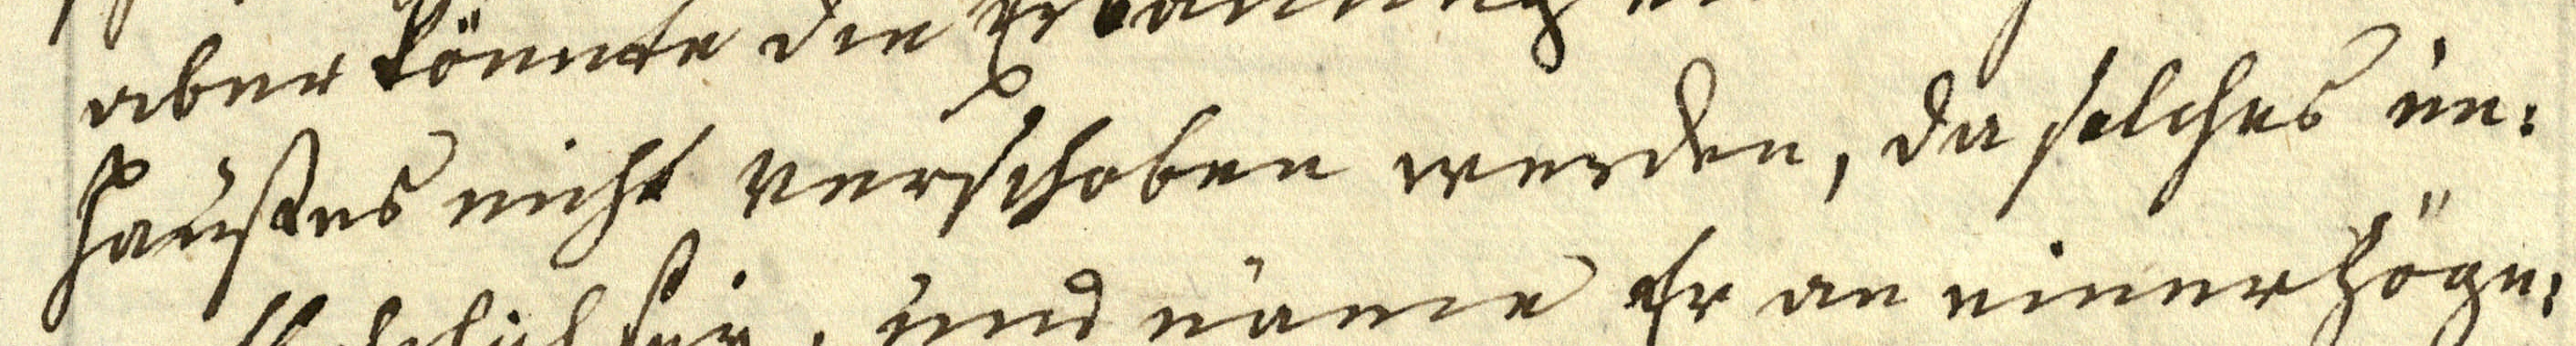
haußes nicht verschoben werden, da solches un¬
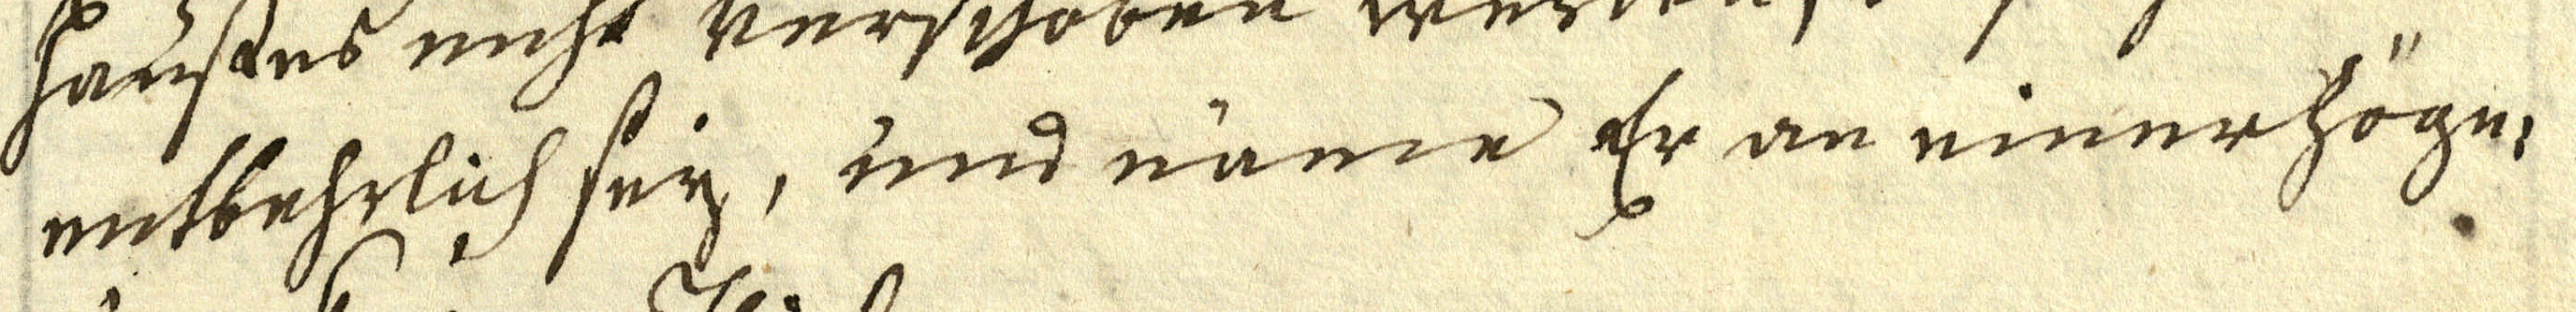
entbehrlich seÿ, und näme Er an einer Zöge¬
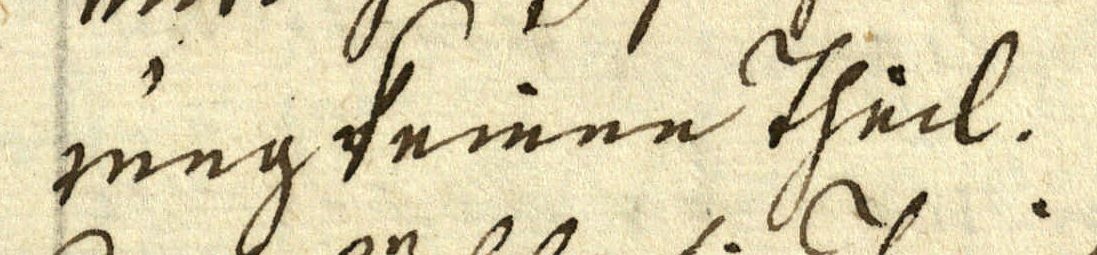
rung keinen Theil.
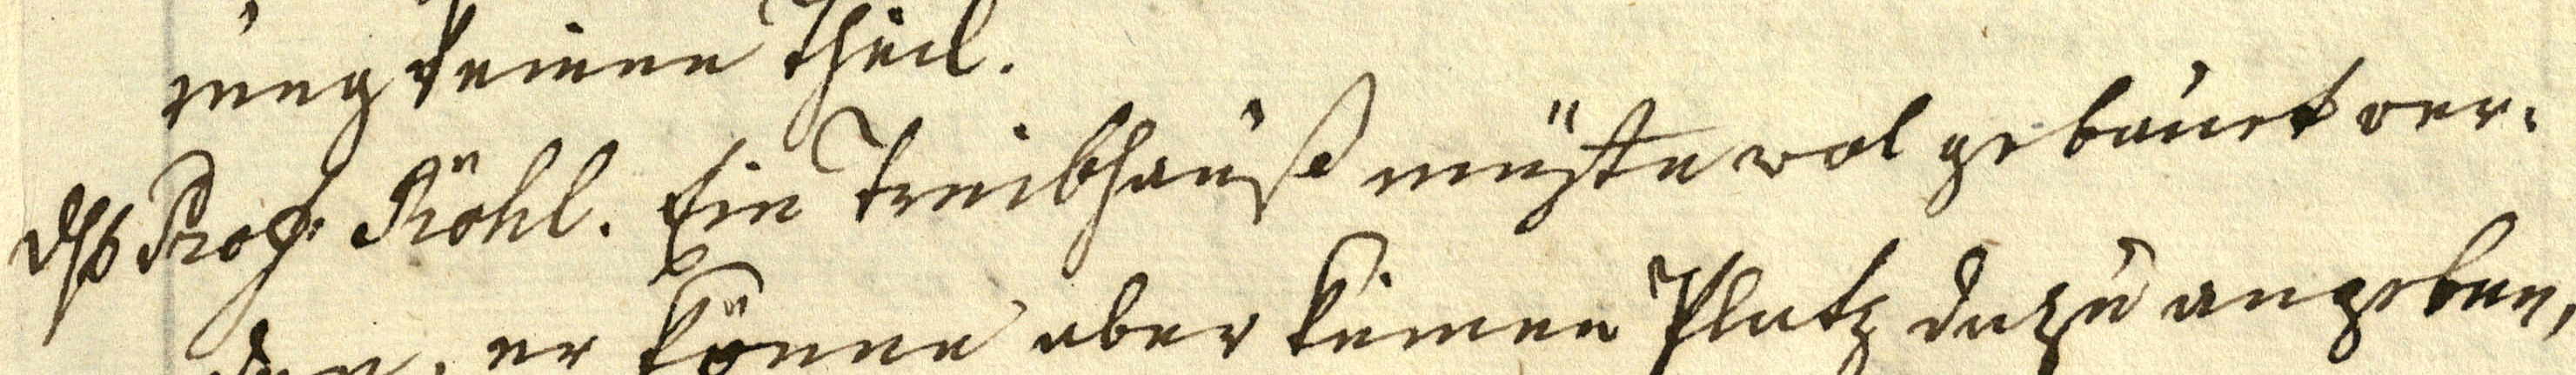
dh Prof. Röhl. Ein Treibhauß müste wol gebauet wer¬
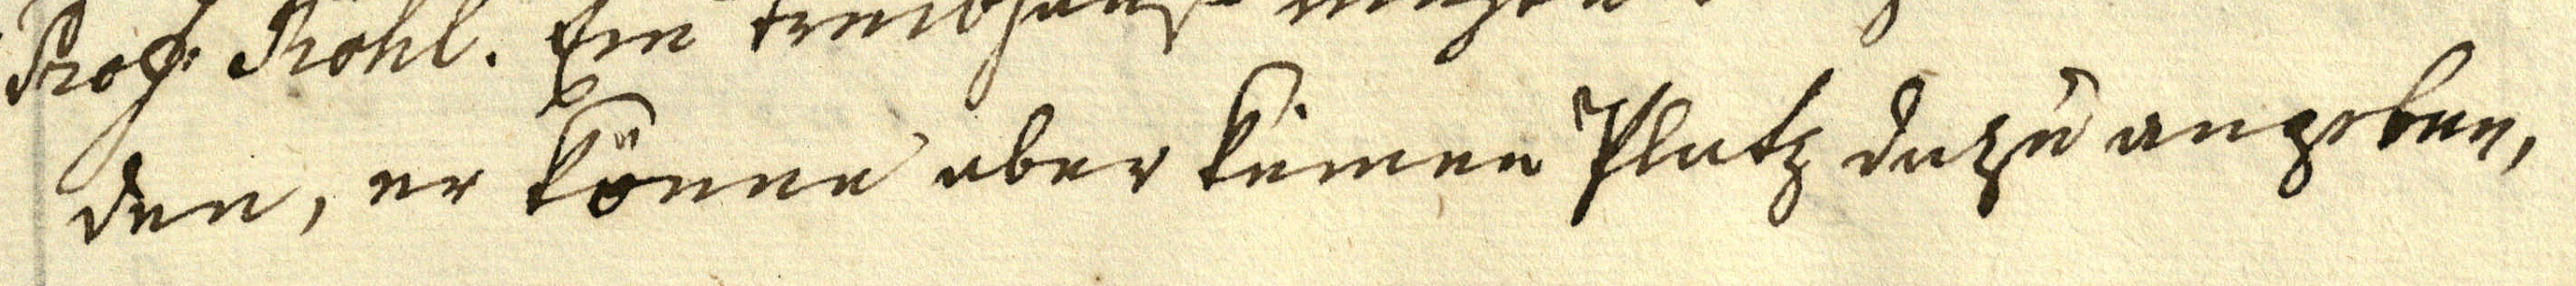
den, er könne aber keinen Platz dazu angeben,
